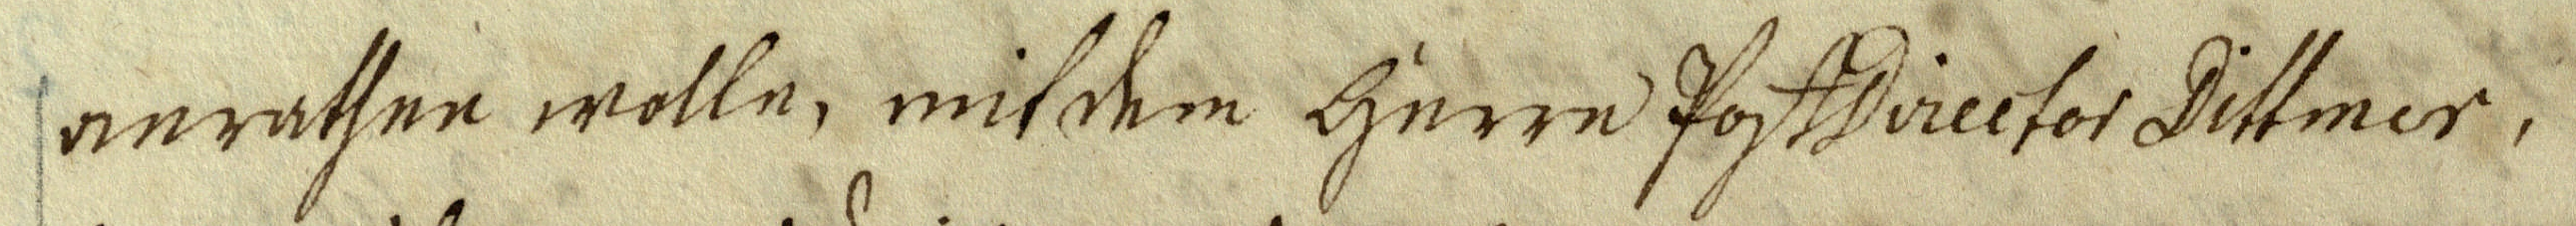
anrathen wolle, mit dem Herrn PostDirector Dittmer,
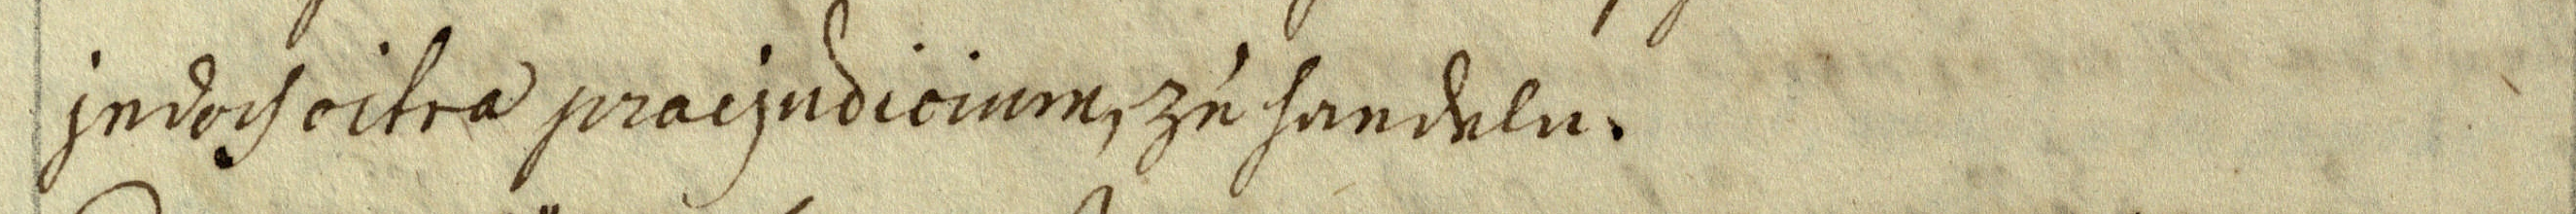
jedoch citra praejudicium zu handeln.
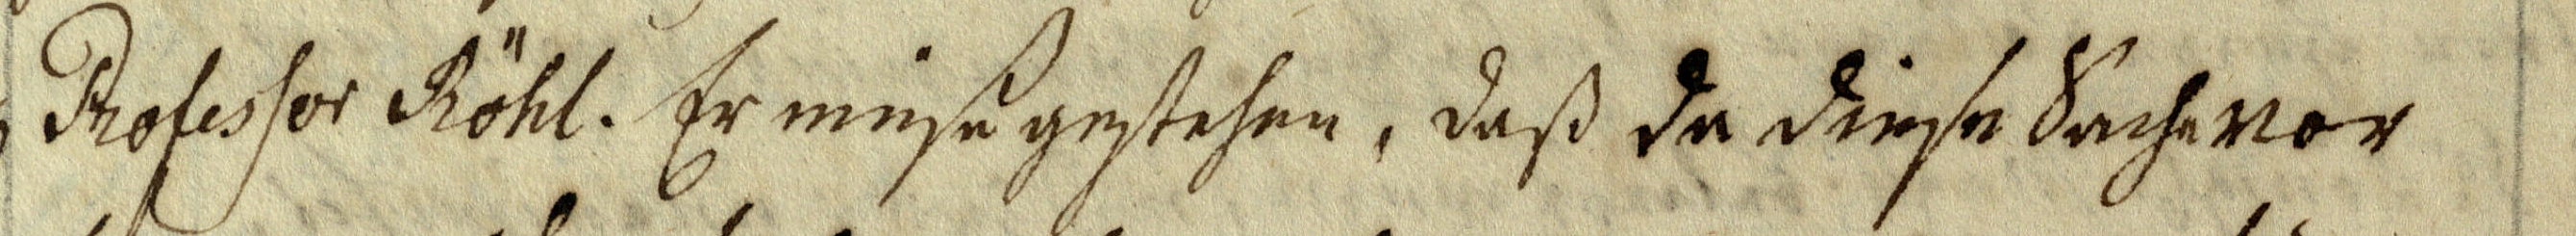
dh Professor Röhl. Er müße gestehen, daß da diese Sache vor
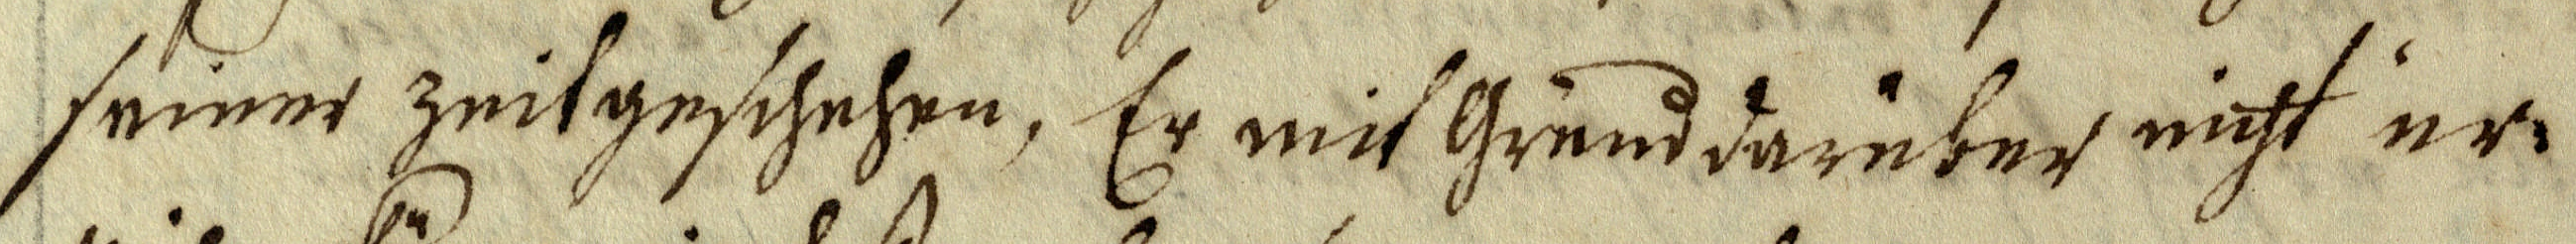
seiner Zeit geschehen, Er mit Grund darüber nicht ur¬
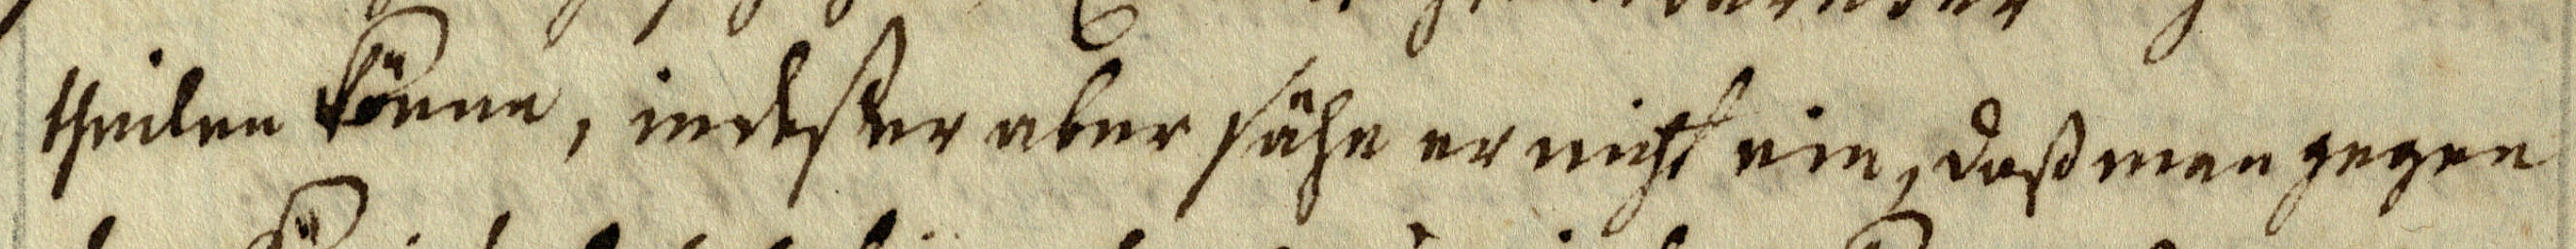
theilen könne, indeßen aber sähe er nicht ein, daß man gegen
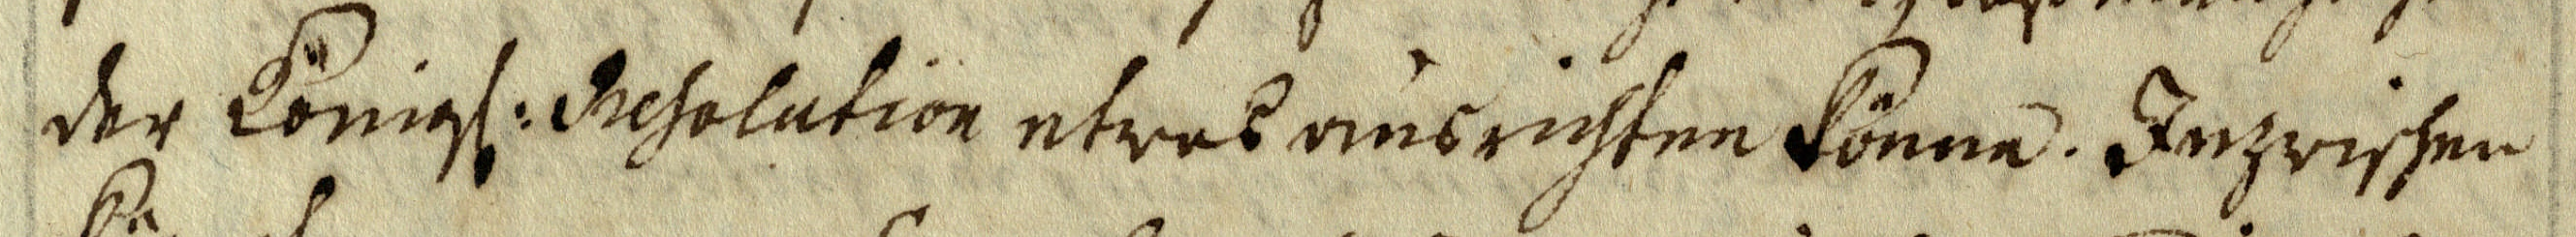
der Königl. Resolution etwas ausrichten könne. Inzwischen
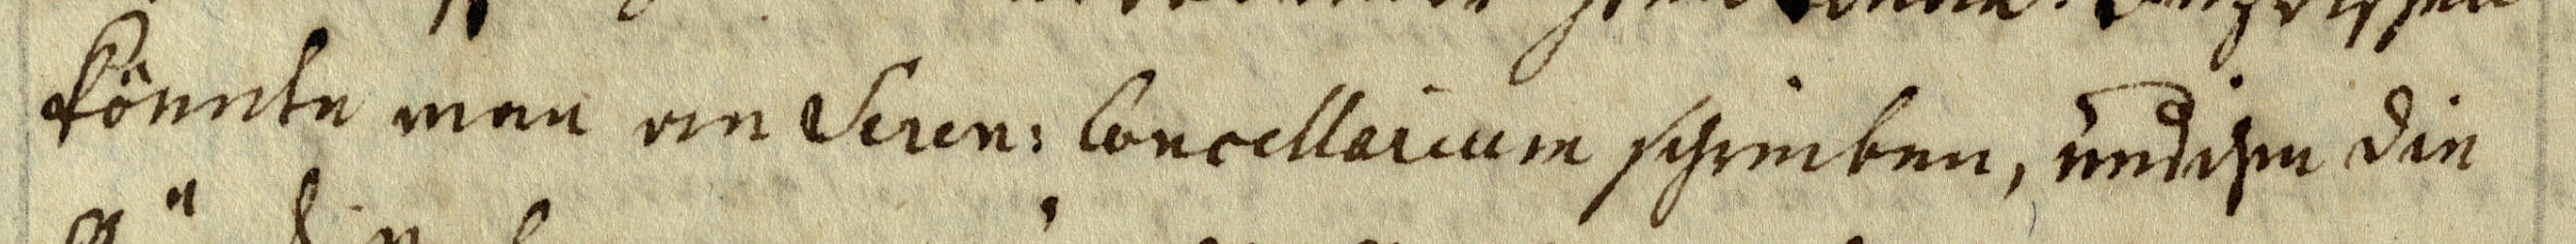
könnte man an Seren. Cancellarium schreiben, und ihm die
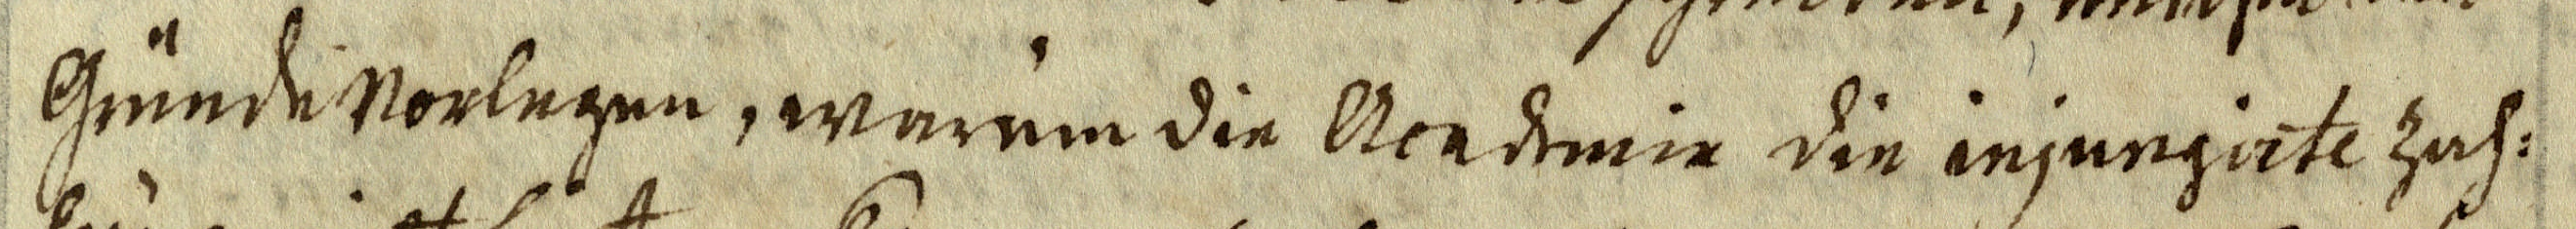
Gründe vorlegen, warum die Academie die injungirte Zah¬
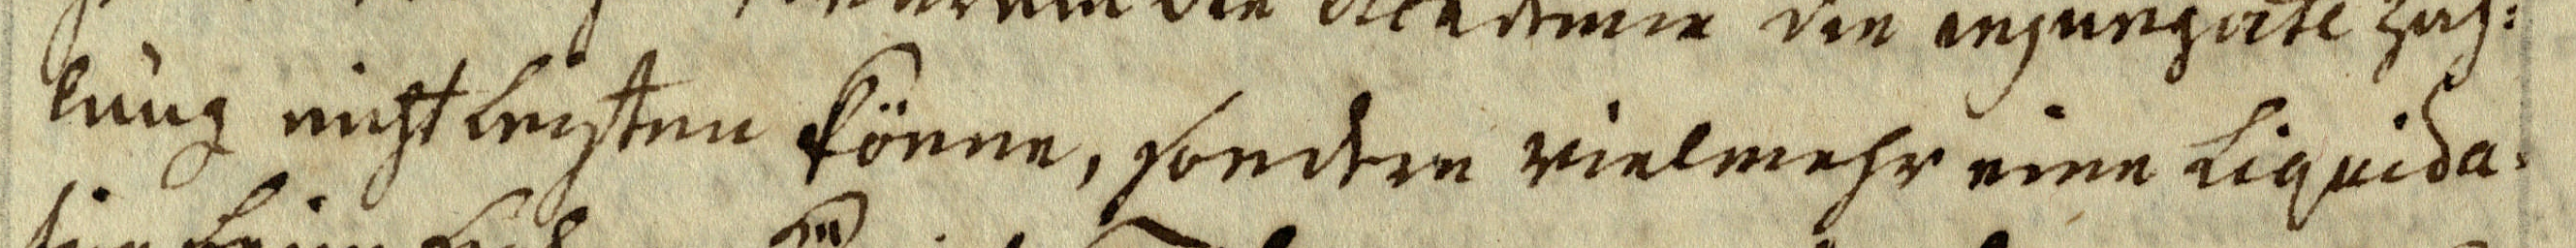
lung nicht leisten könne, sondern vielmehr eine Liquida¬
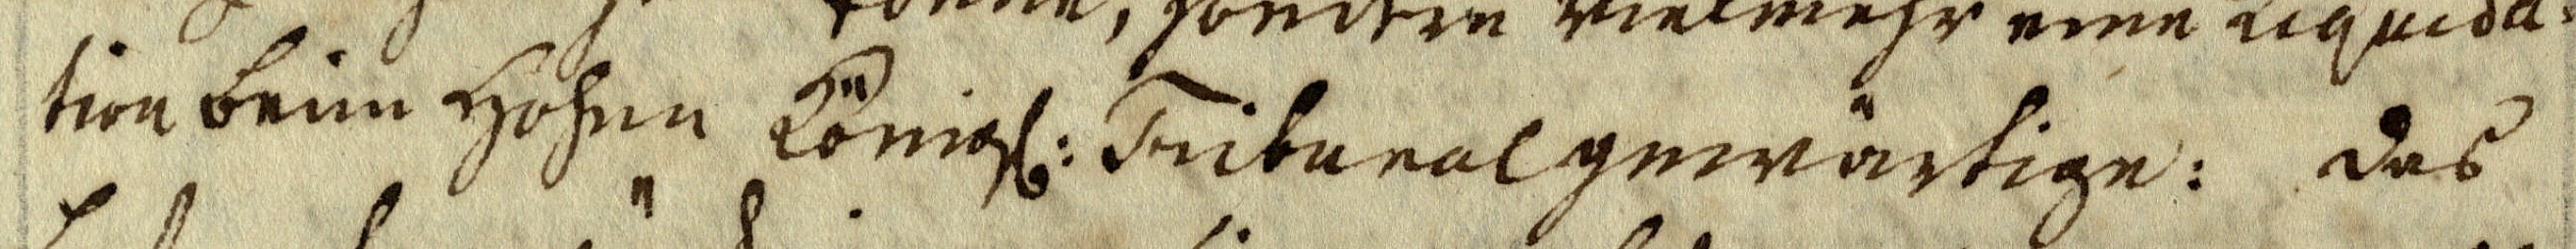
tion beim Hohen Königl. Tribunal gewärtige: das
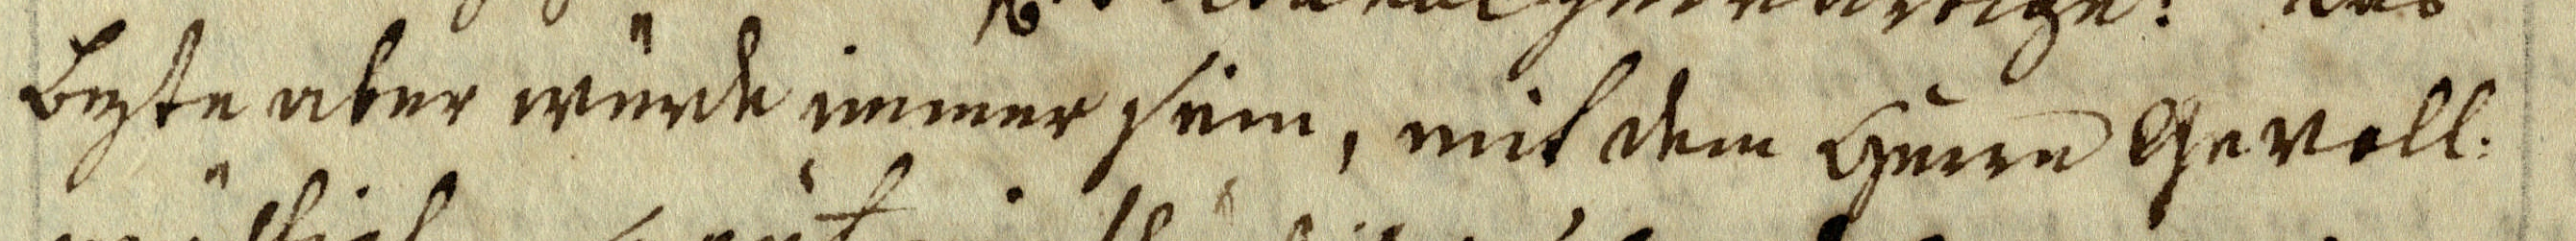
lezte aber würde immer sein, mit dem Herrn Gevoll¬
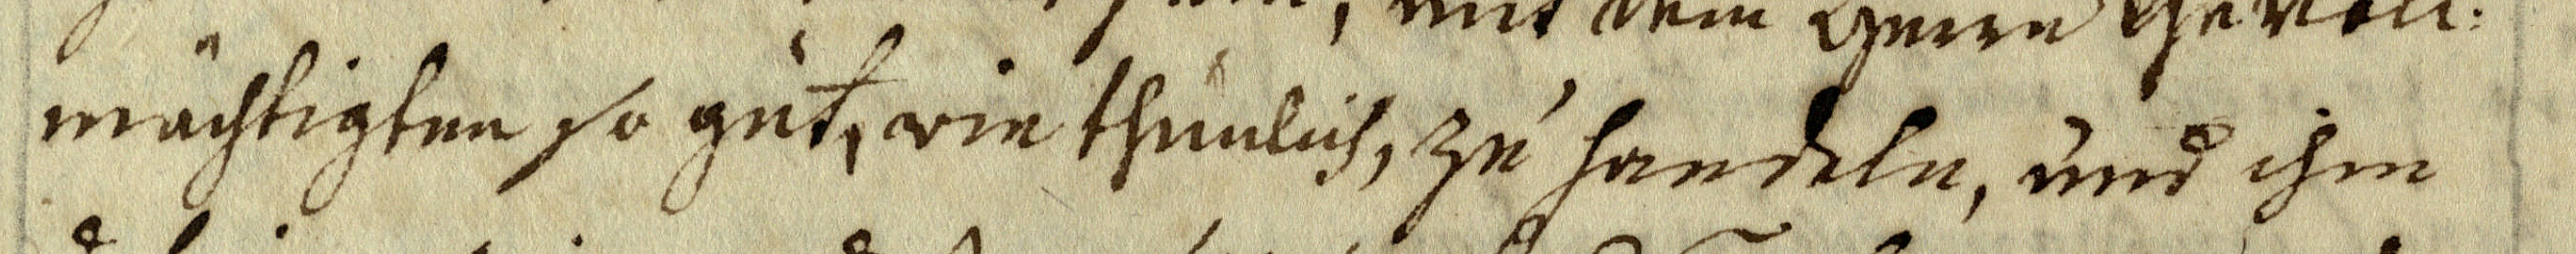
mächtigten so gut, wie thunlich, zu handeln, und ihm
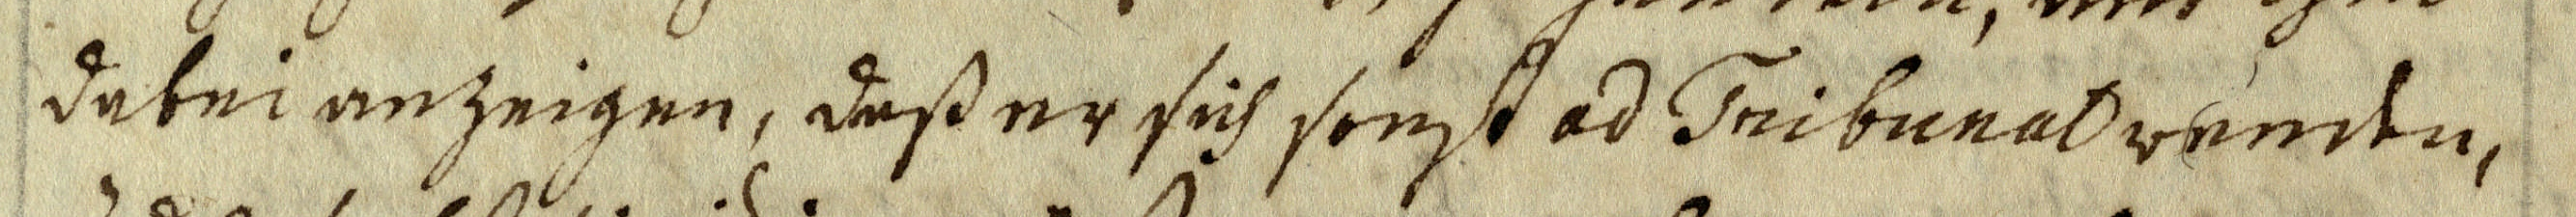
dabei anzeigen, daß er sich sonst ad Tribunal wenden,
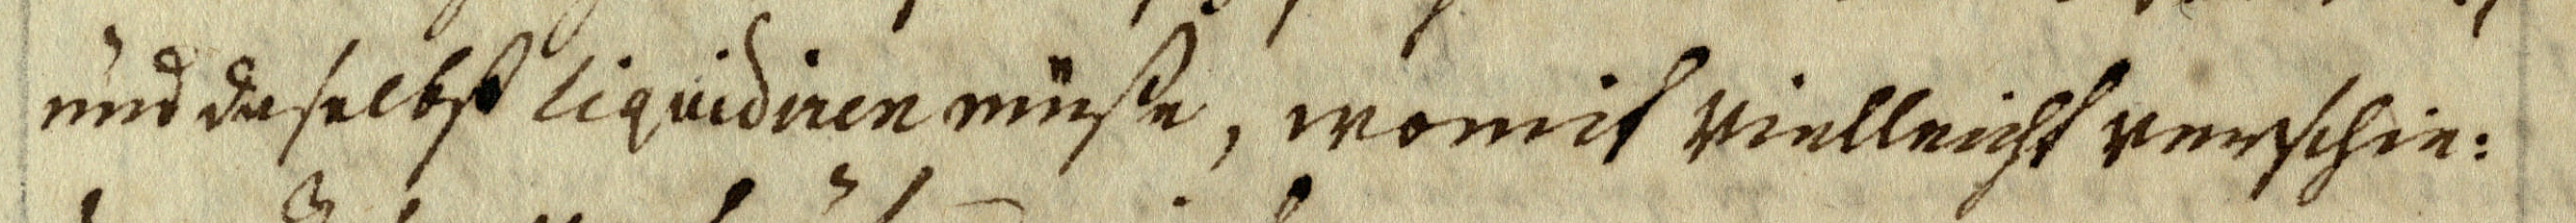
und daselbst liquidiren müße, womit vielleicht verschie¬
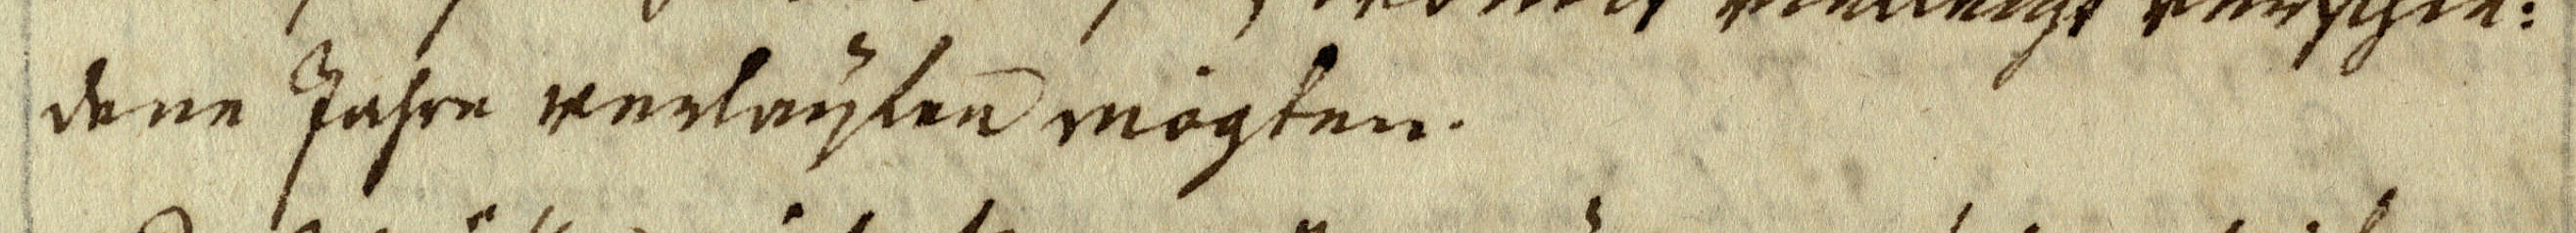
dene Jahre verlaufen mögten.
